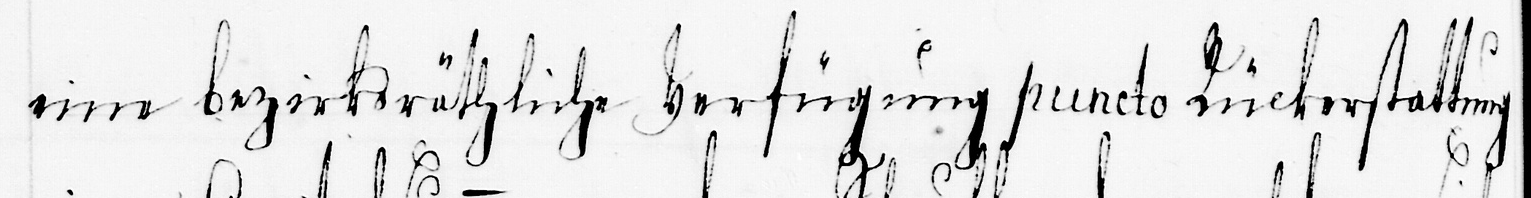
eine bezirksräthliche Verfügung puncto Rückerstattung
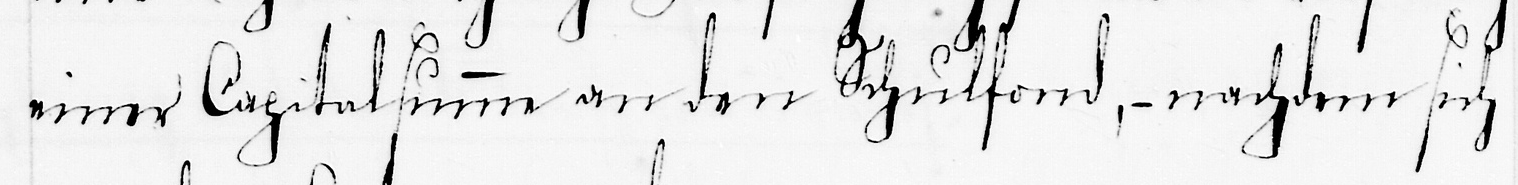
einer Capitalsumme an den Schulfond, – nachdem sich
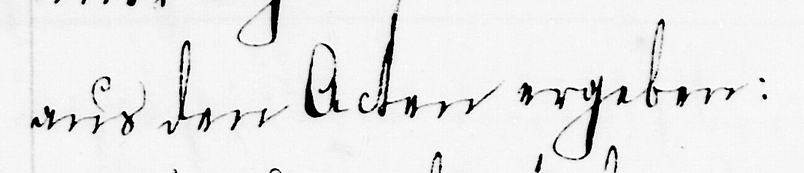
aus den Acten ergeben:
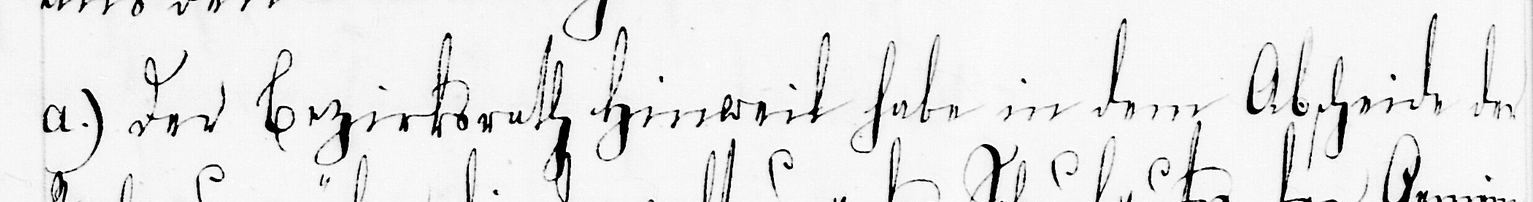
a.) Der Bezirksrath Hinweil habe in dem Abscheide der
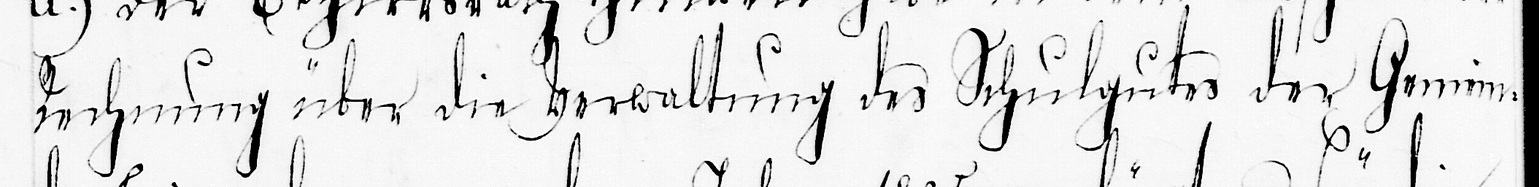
Rechnung über die Verwaltung des Schulgutes der Gemei¬
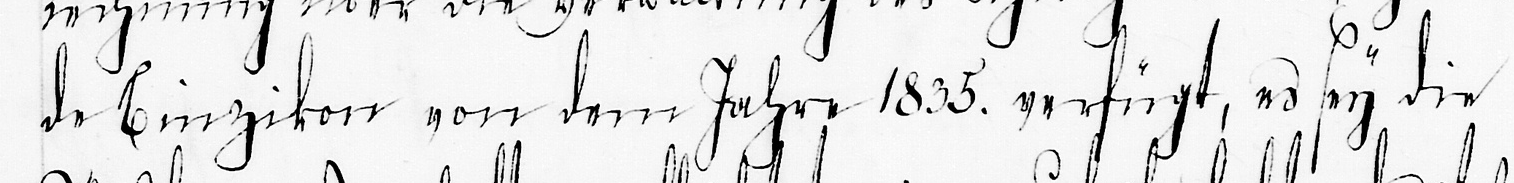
nde Binzikon von dem Jahre 1835. verfügt, es sey die
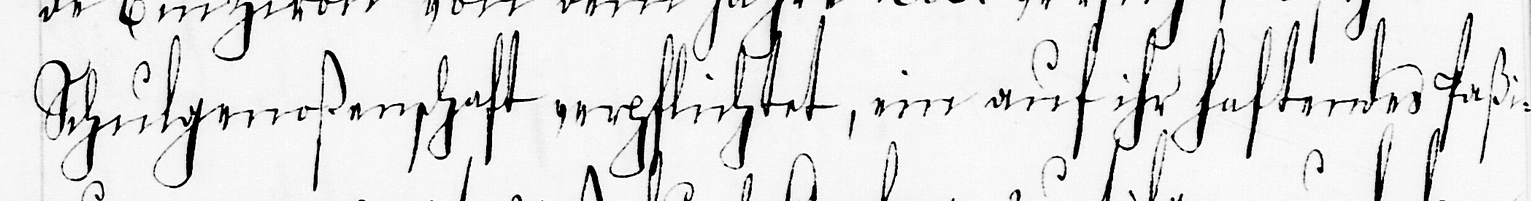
Schulgenoßenschaft verpflichtet, ein auf ihr haften¬
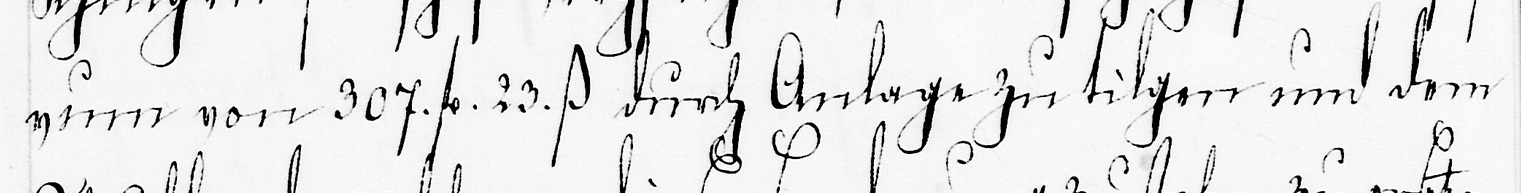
vum von 307. fl. 23. ß durch Anlage zu tilgen und dem
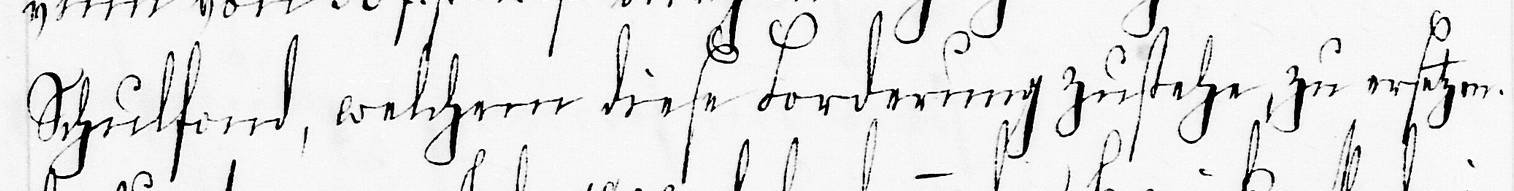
Schulfond, welchem diese Forderung zustehe, zu ersetze¬
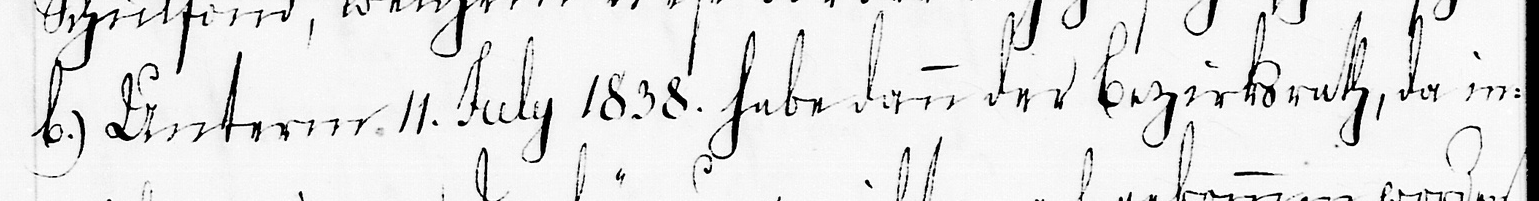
b.) Unterm 11. July 1838. habe dann der Bezirksrath, da in¬
